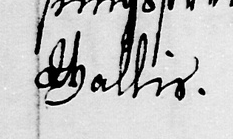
Wallis,
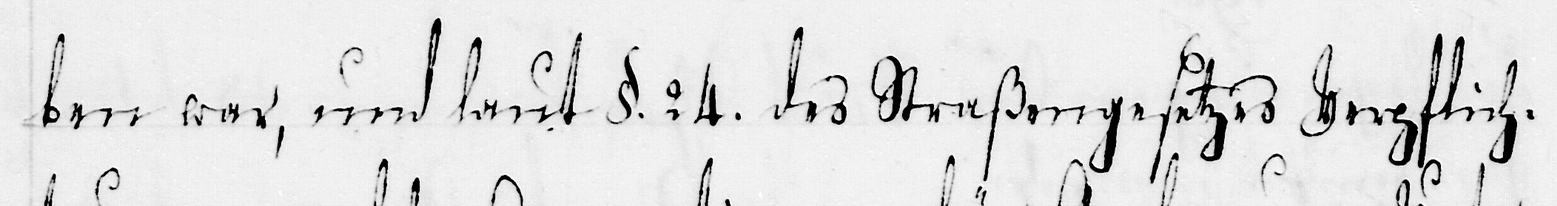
ben war, und laut §. 24. des Straßengesetzes Verpflich¬
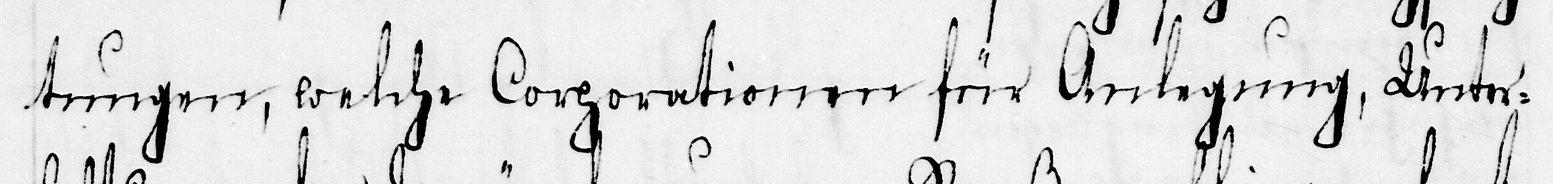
tungen, welche Corporationen für Anlegung, Unter¬
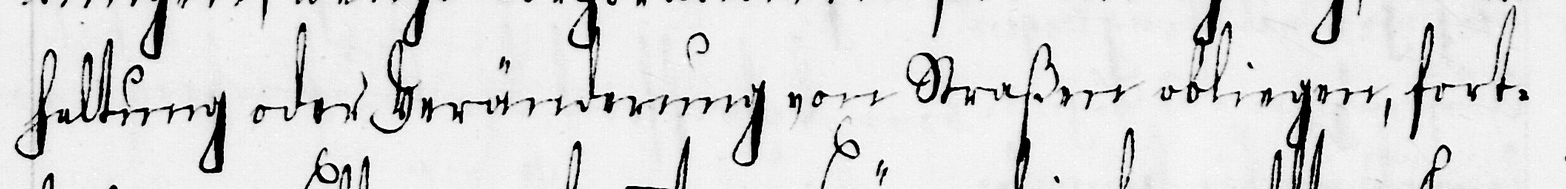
haltung oder Veränderung von Straßen obliegen, fort¬
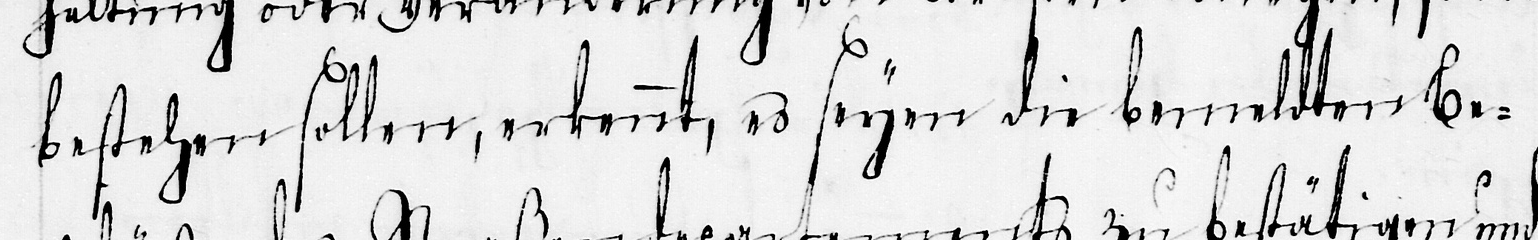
bestehen sollen, erkennt, es seyen die bemeldten Be¬
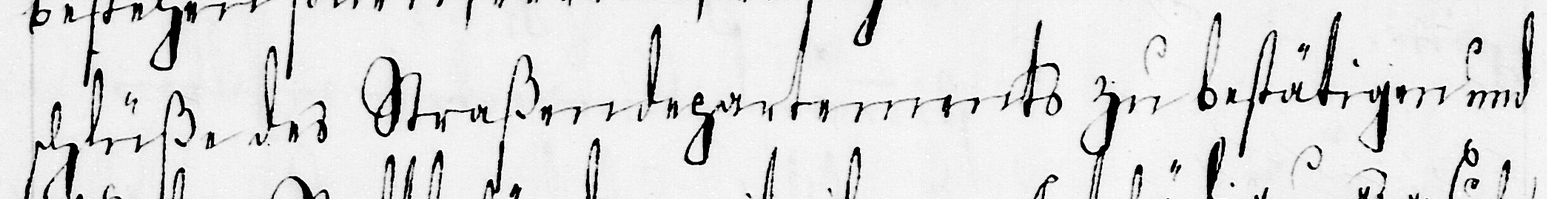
schlüße des Straßendepartements zu bestätigen und
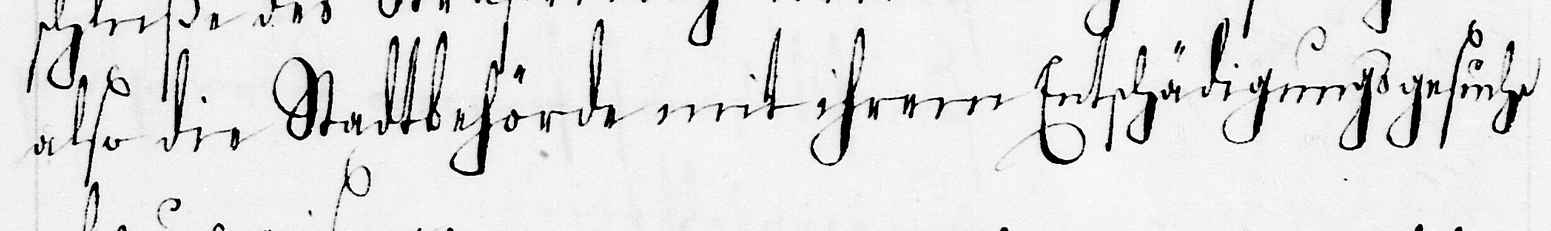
also die Stadtbehörde mit ihrem Entschädigungsgesuche
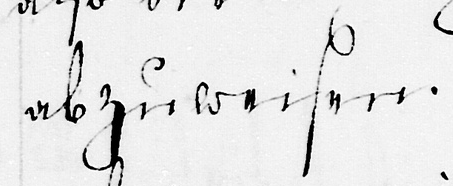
abzuweisen.
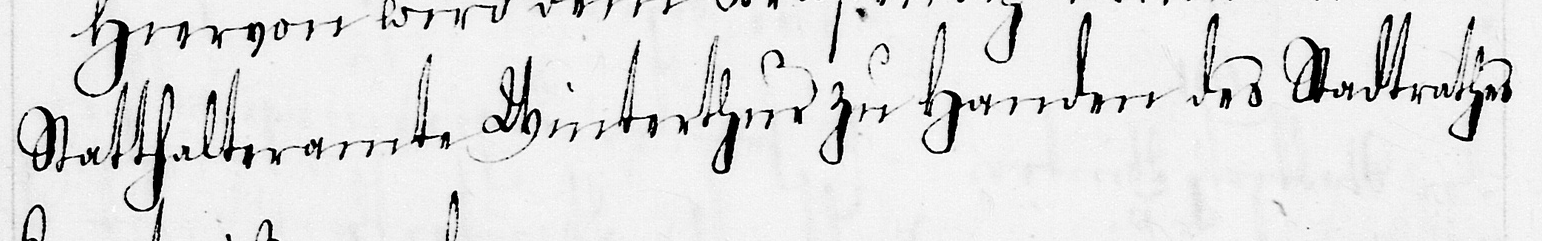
Statthalteramte Winterthur zu Handen des Stadtrathes
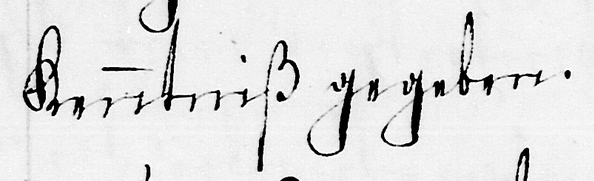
Kenntniß gegeben.
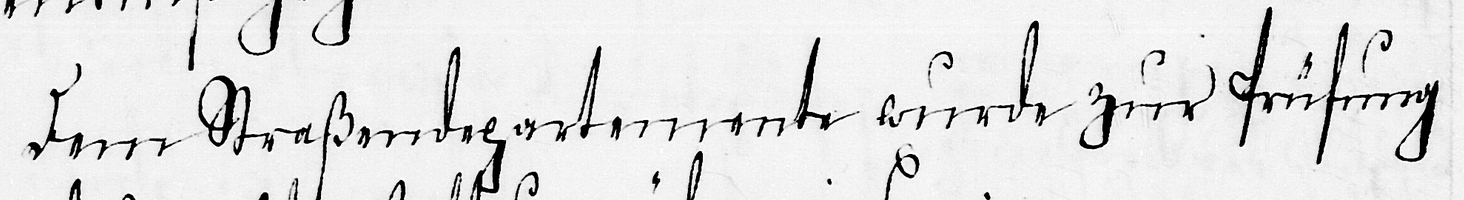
Dem Straßendepartemente wurde zur Prüfung
